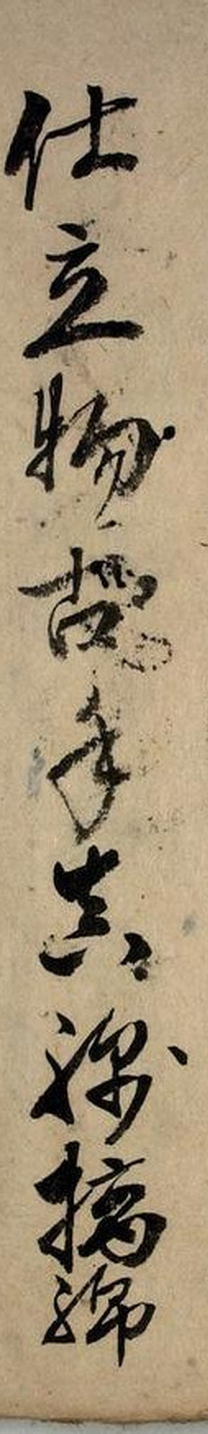仕立物古手真綿搞綿
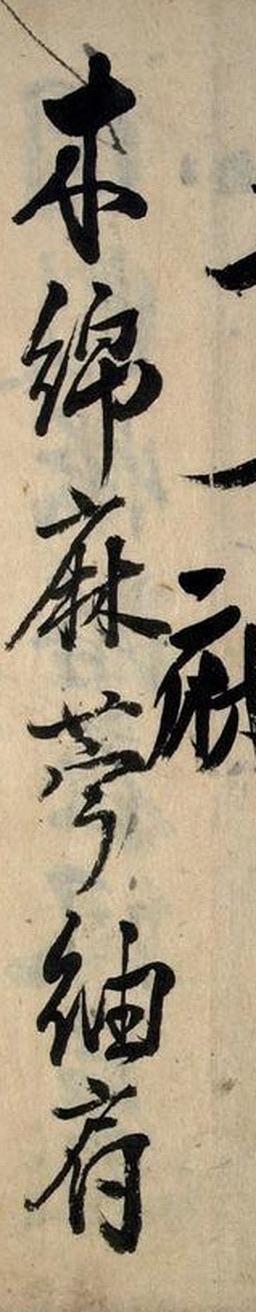木綿麻苧紬肩
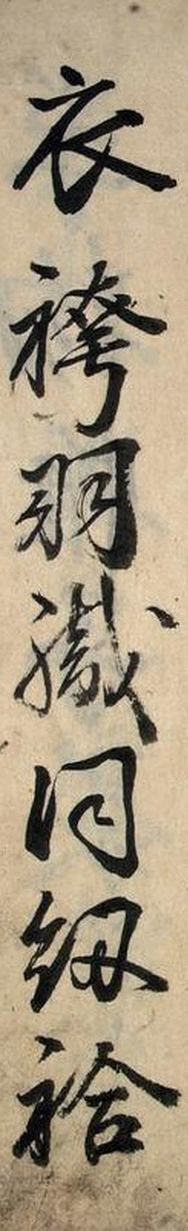衣袴羽織同紋袷

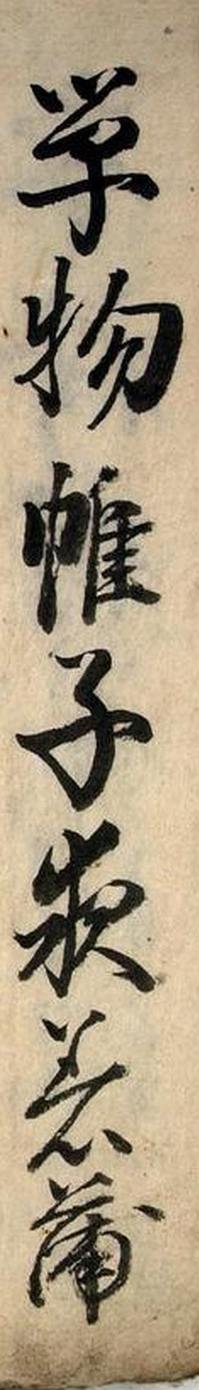単物帷子夜着蒲
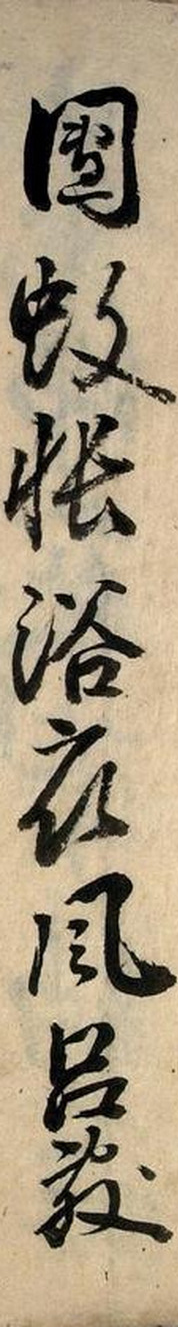団蚊帳浴衣風呂敷
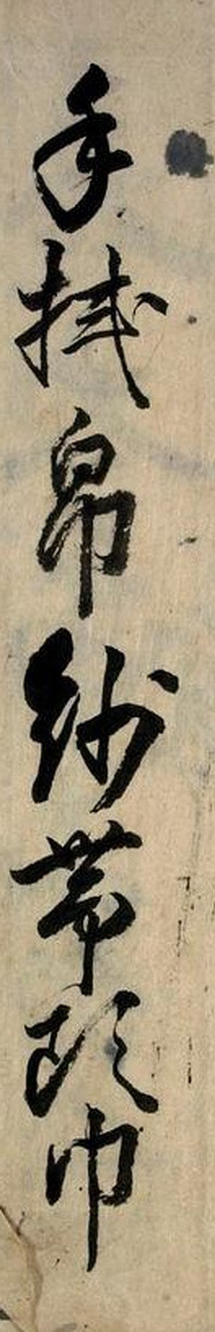手拭帛紗帯頭巾
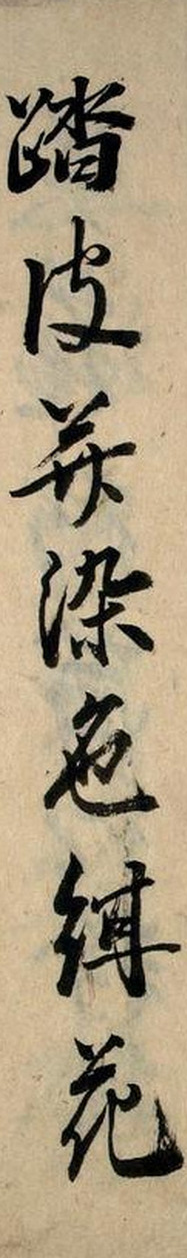踏皮并染色紺花
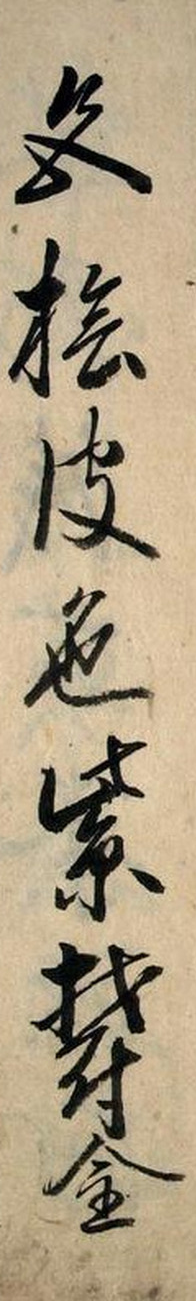宮檜皮色紫材付金

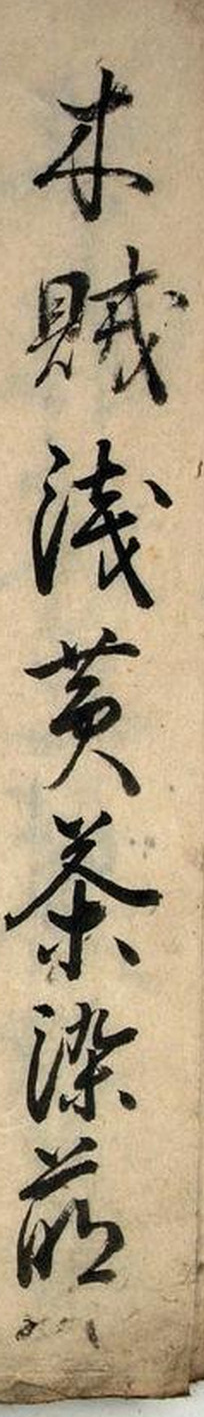木賊浅黄茶染萌
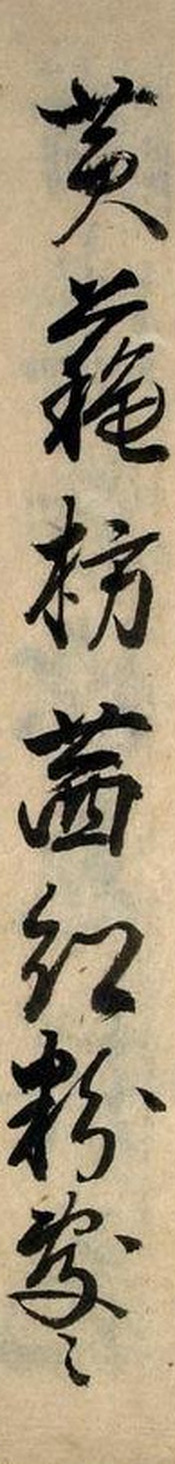黄蘒枋茜紅粉処〃
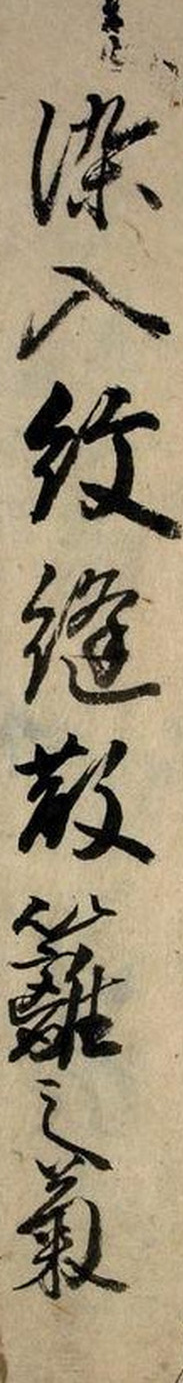染入紋縫散籬之菊
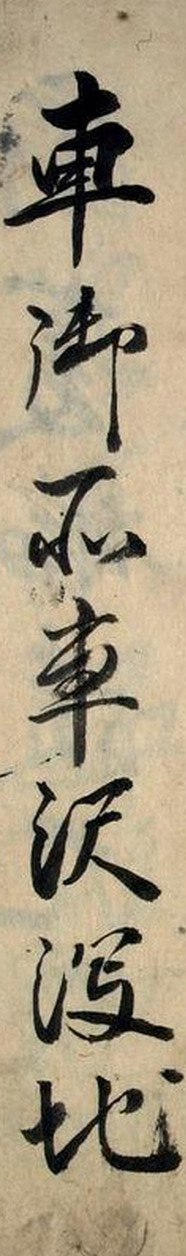車御所車沢潟地

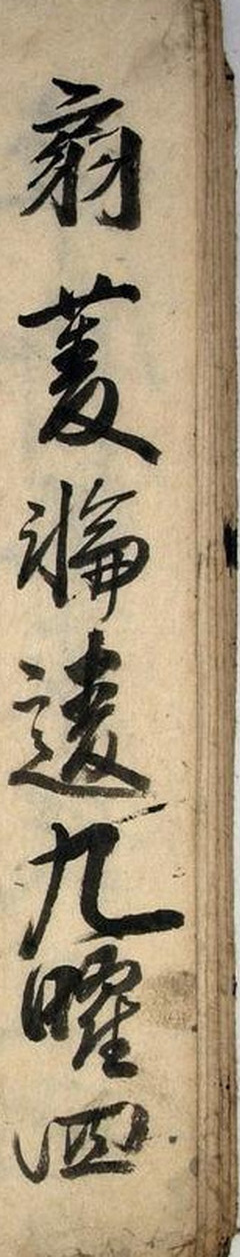扇菱輪遠九曜四
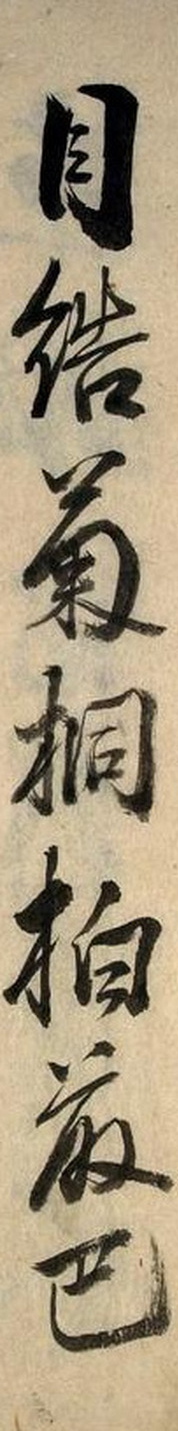目結菊霧桐柏藤巴
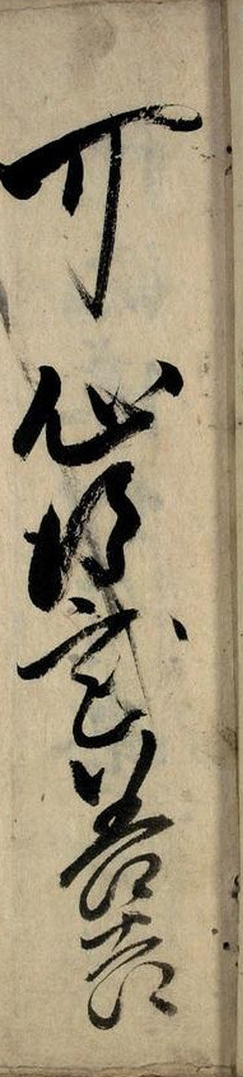可心得言善吉
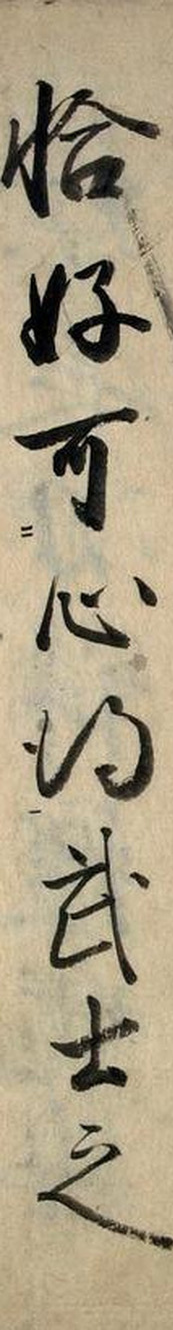恰好可心得武士之
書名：商売往来（往来物、手習）
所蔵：福井県文書館 Fukui Prefectural Archives
